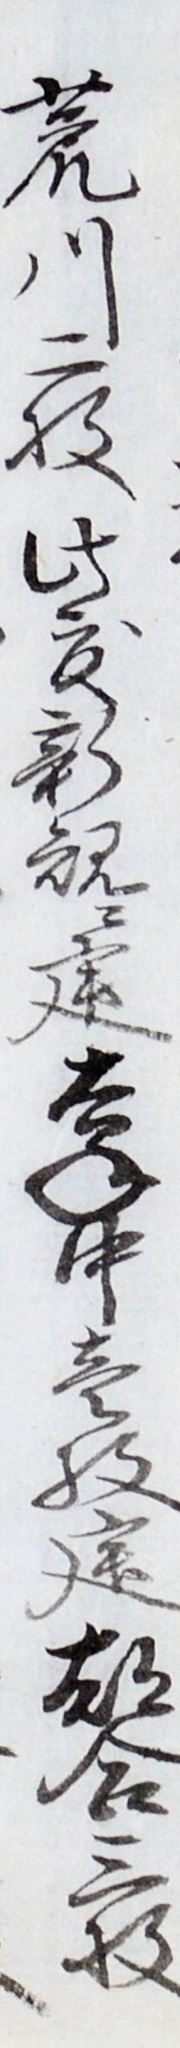荒川二枚此度新規ニ建去年中壱枚建都合三枚
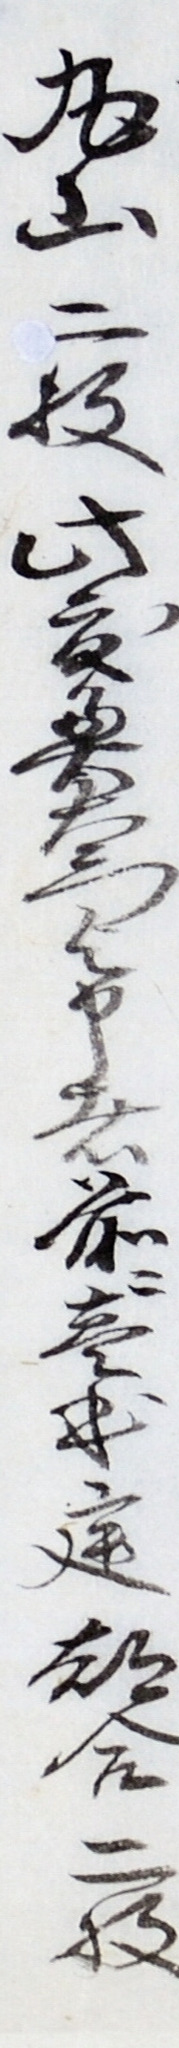丸山二枚此度奥右衛門と申者前ニ壱本建都合二枚
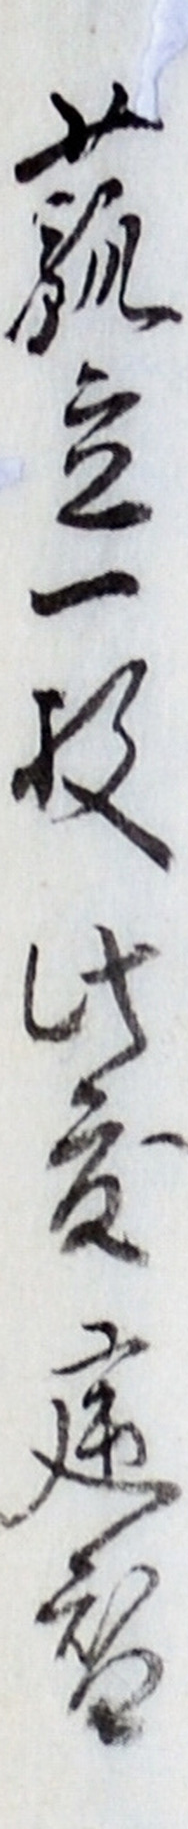菰立一枚此度建替
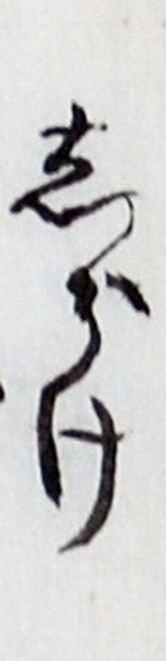しらけ
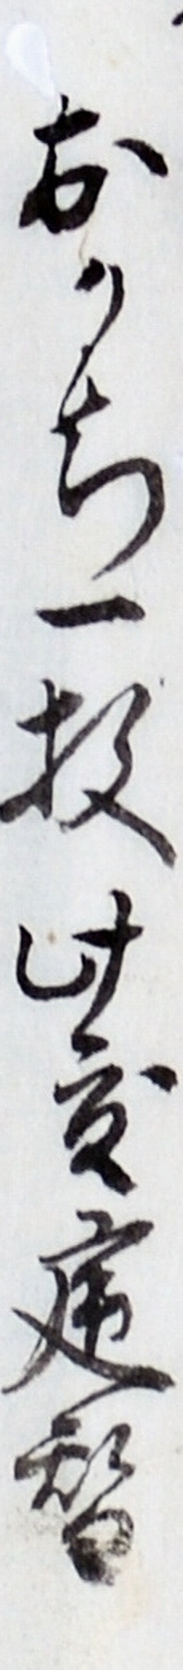おかち一枚此度建替
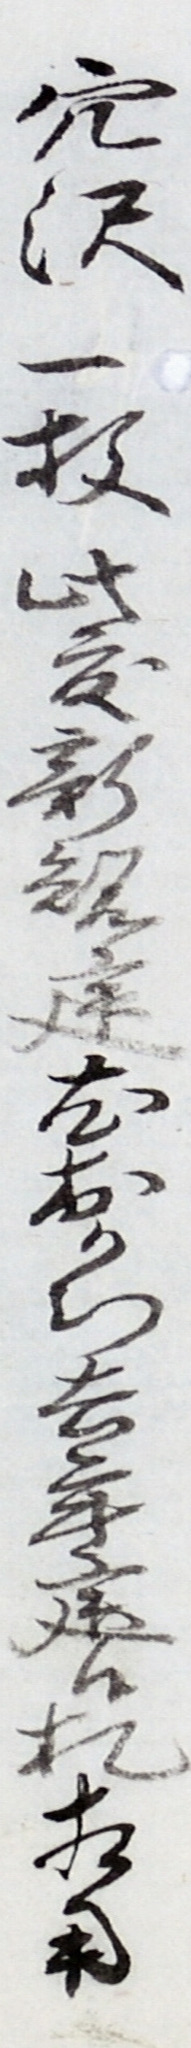一穴沢一枚此度新規建尤おかち去年建候札相用
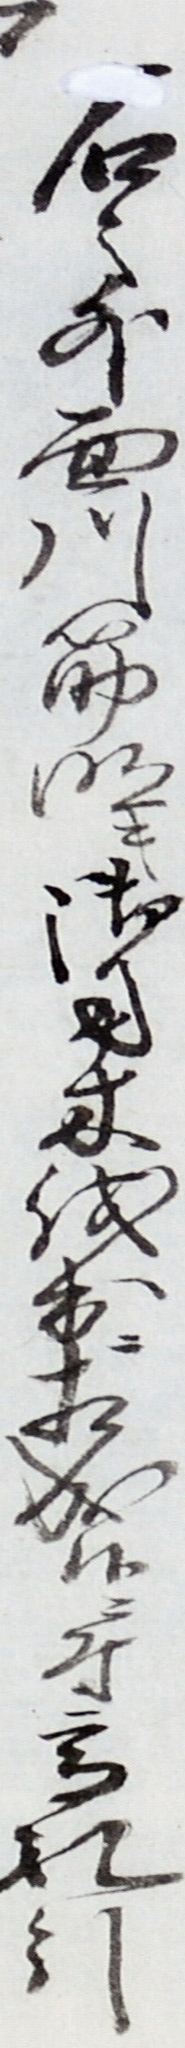右之外面川筋明キ御用木伐出ニ相成候ニ付高札引
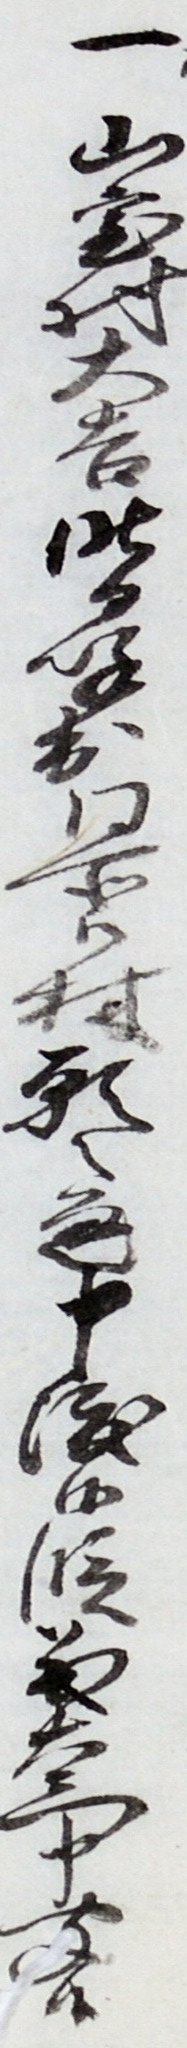一山室村大吉昨日呼出同所御村願之通申渡候段義右衛門申聞候
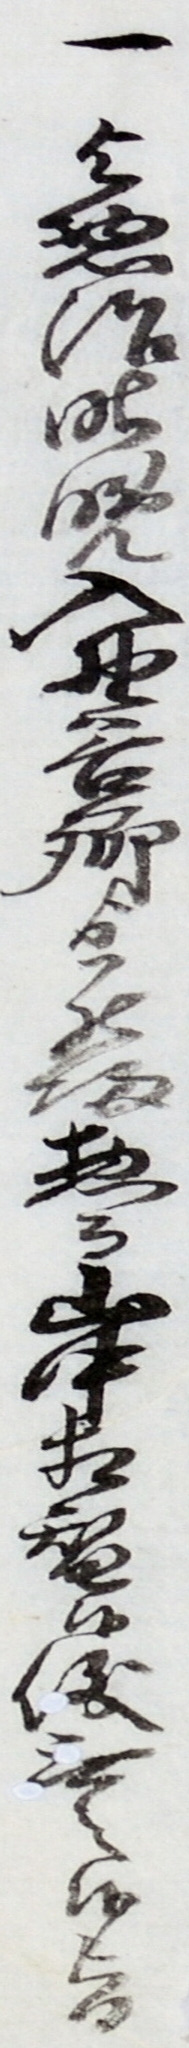一与惣治昨晩入野谷郷より罷帰惣而山中相替候儀無之候旨
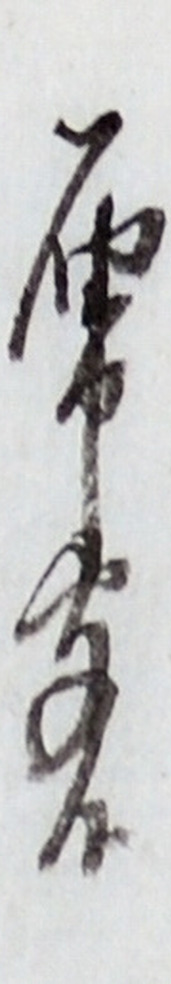届申聞候
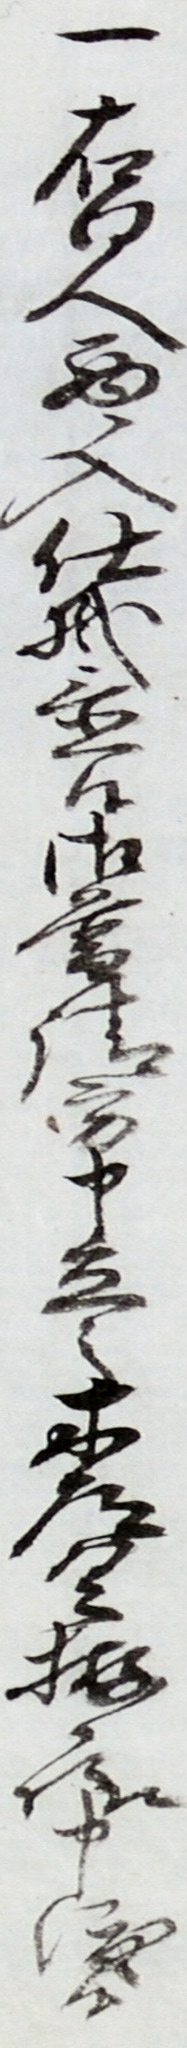一右同人西ノ入仕掛置候御普請方申立之木道具拵候様申渡候
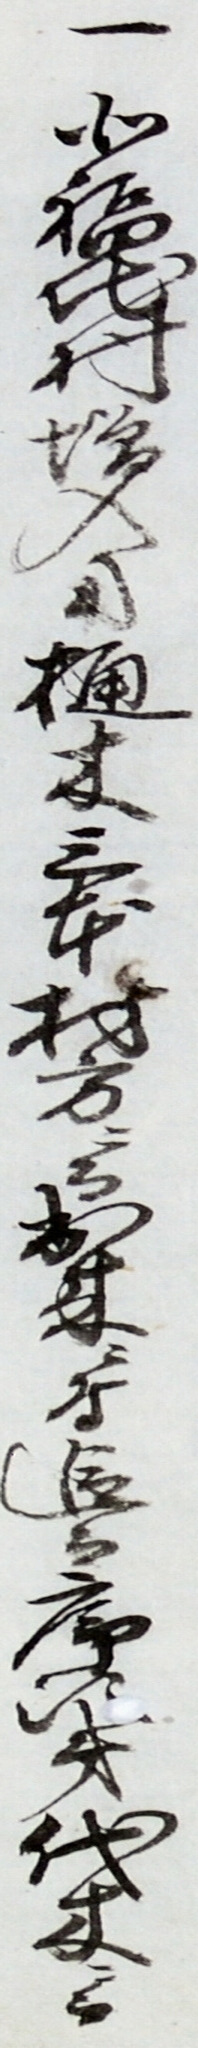一北福地村増入用樋木三本村方ニ而出来ニ付追而序次第代木ニ而
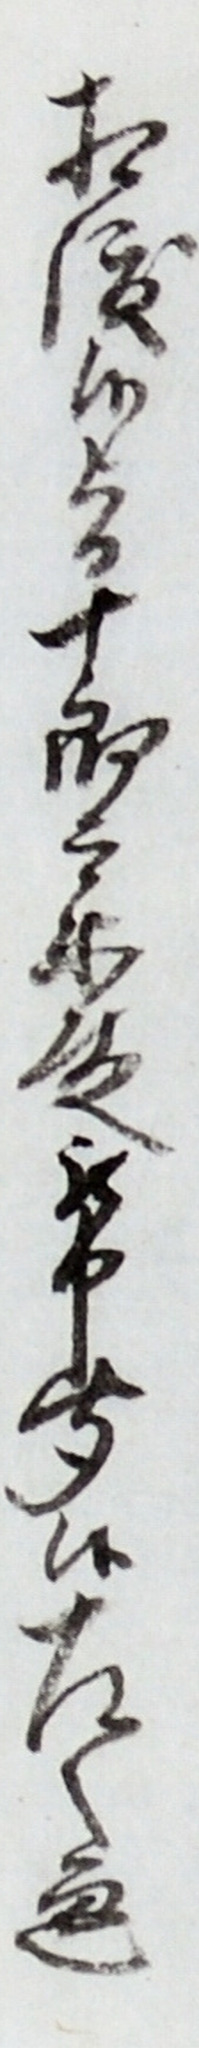相渡候旨十郎兵衛殿被申聞候左之通
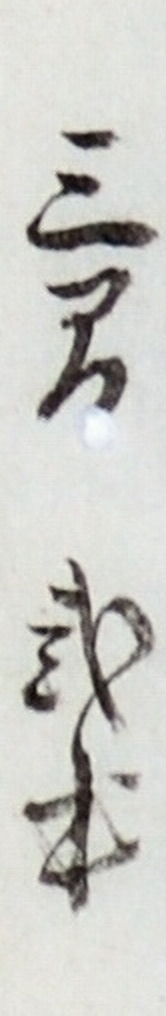三間弐本

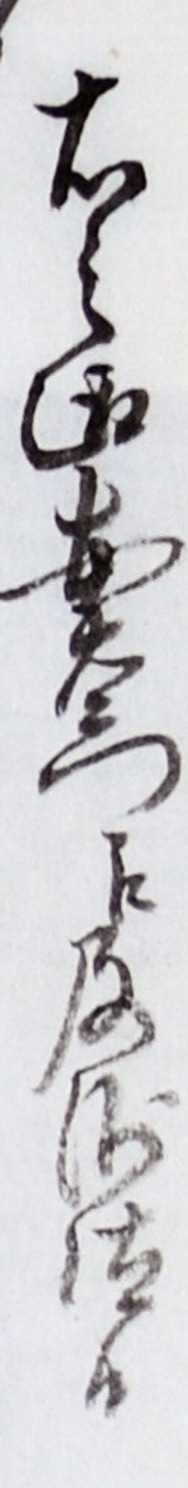右之趣安右衛門江及沙汰候
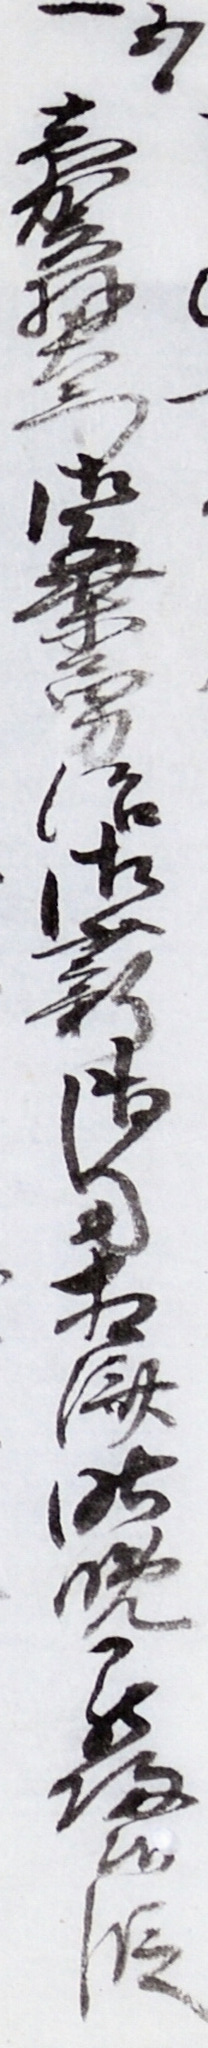一志賀羽右衛門御子柴勇治御供御薪御用相済昨晩罷帰候段
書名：御山奉行御用控
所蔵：伊那市立高遠町図書館・合同会社AMANE
